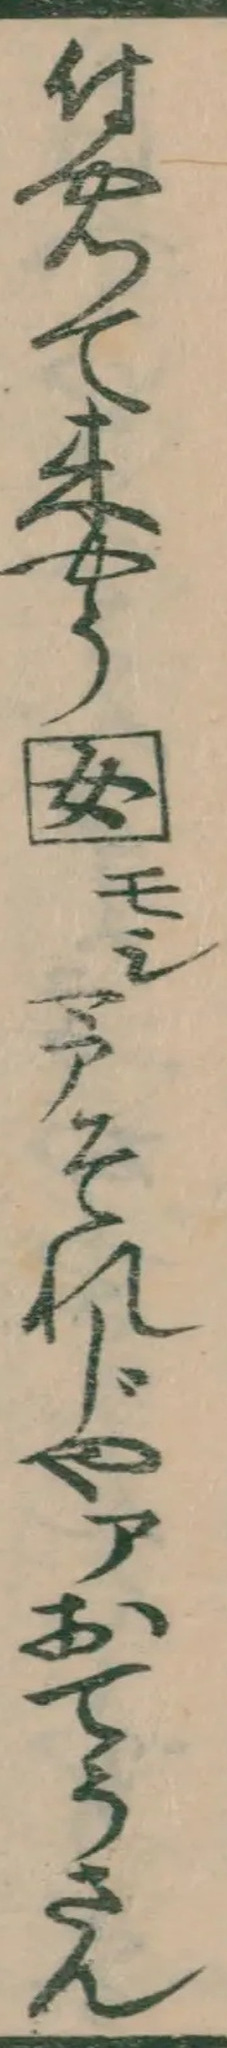付やつて来やう〈女〉モシマアそれじやァおてうさん
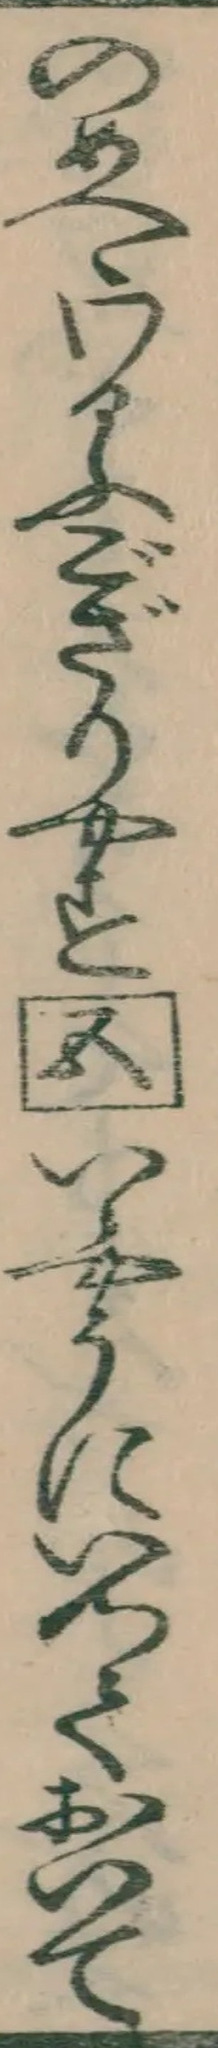のめへゝわるふござりやす〈五〉いゝやうにいつておいて
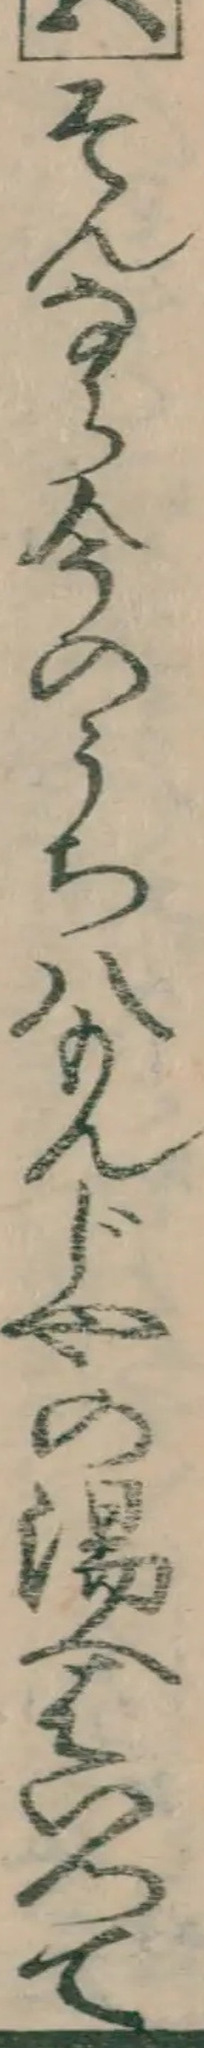〈五〉そんなら今のうち八もんじやの湯へはいつて
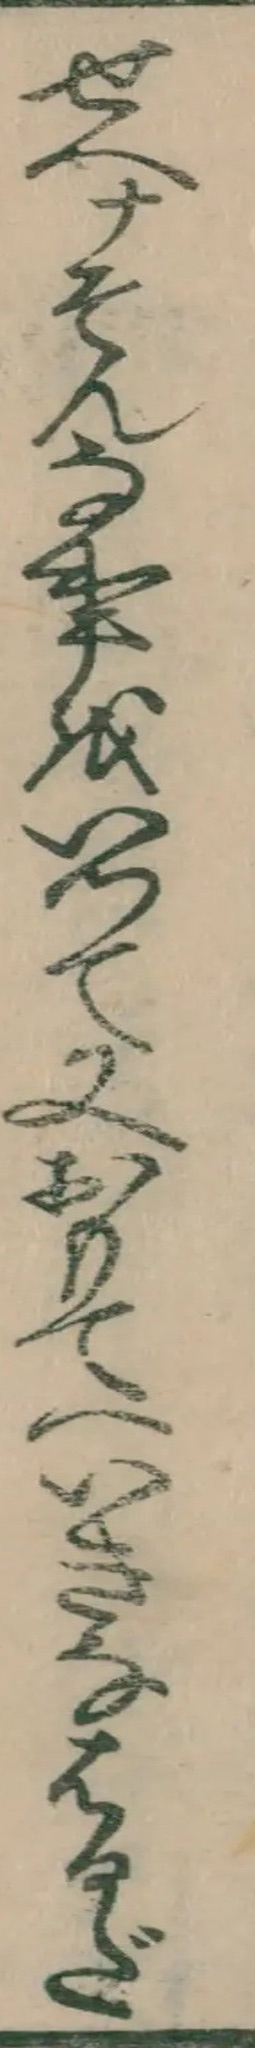せへナそんな事をいつて又おもてへいきなはるだ

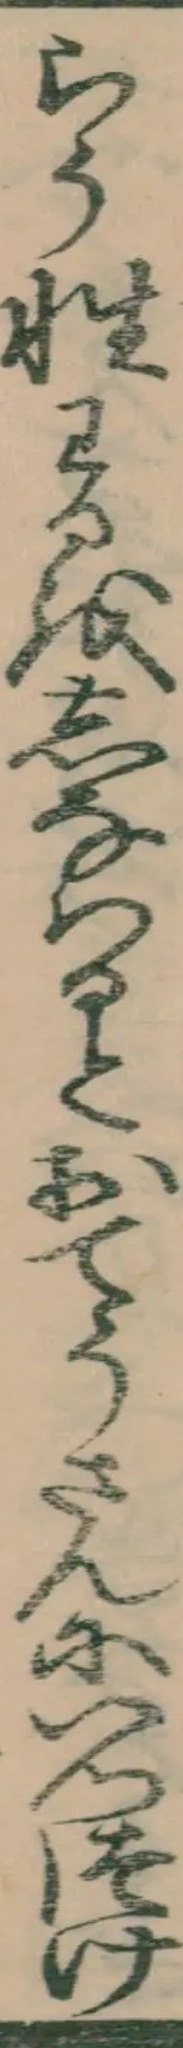らう性わるをしなはるとおてうさんにいつつけ
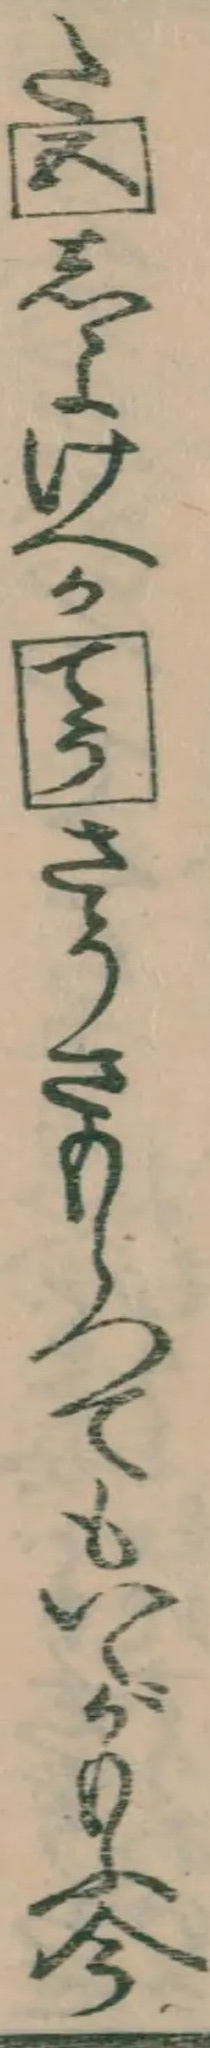た〈五〉しよけへか〈てう〉さうさもらつてもいゝがもふ今
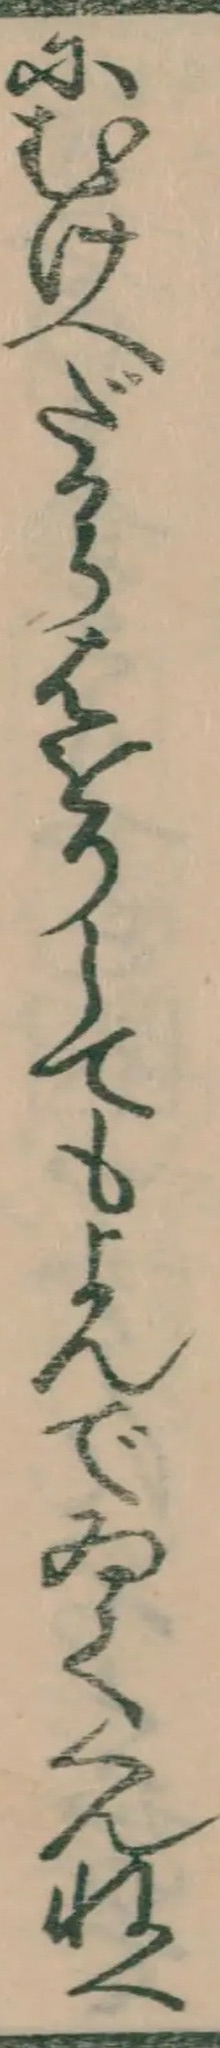にむけへだからはをりしてもよんでゐてくんねへ
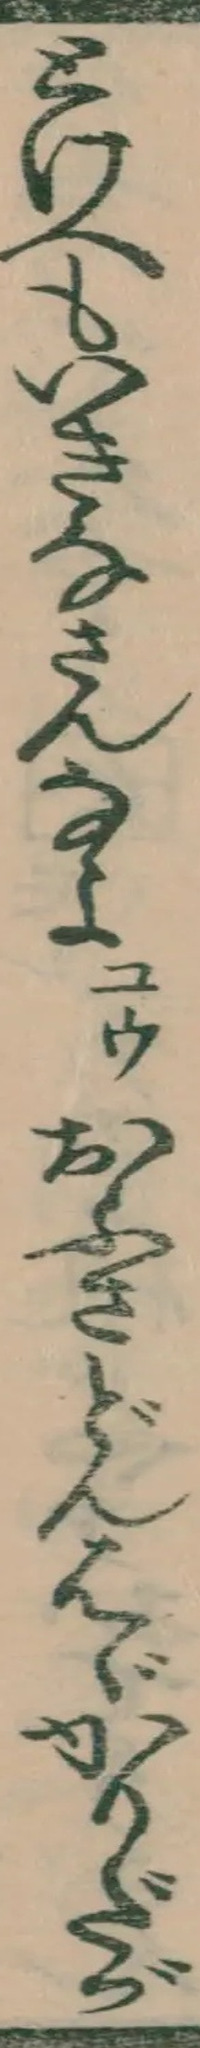とけへもいきなさんなよコウおふさどんはゞかりだが
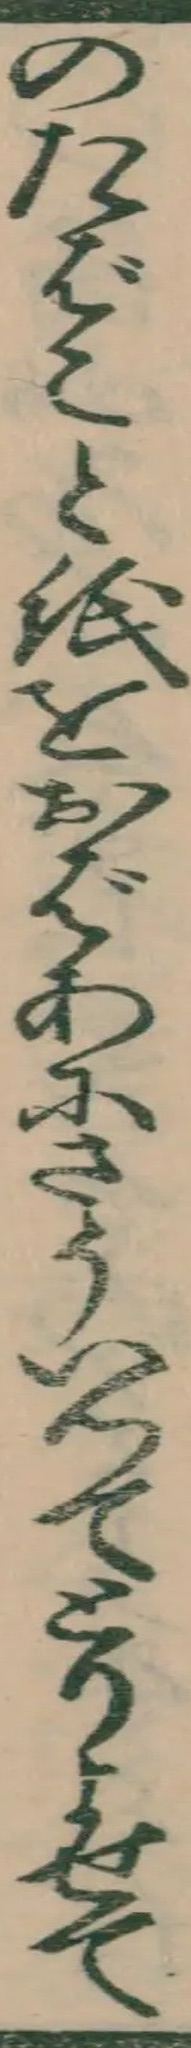のたばこと紙をおばあにさういつてとりよせて
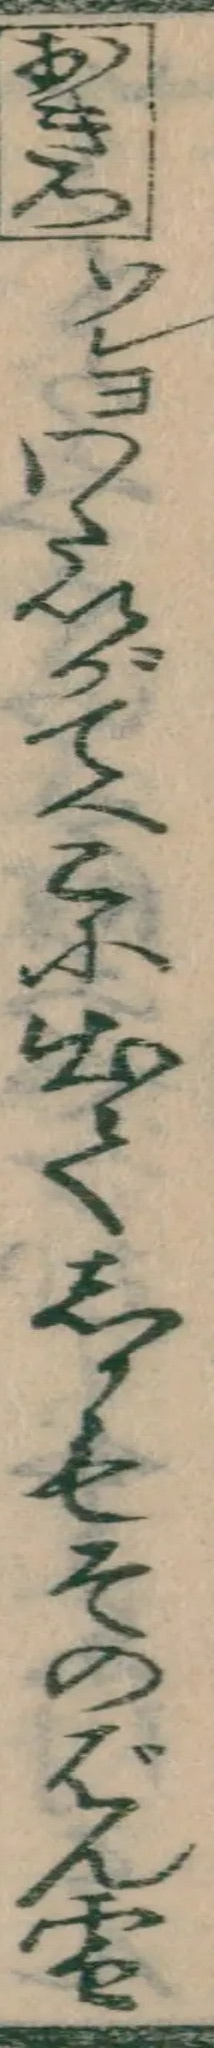〈おきつ〉ソレヨわたいがてへこに出てしかもそのばん雪
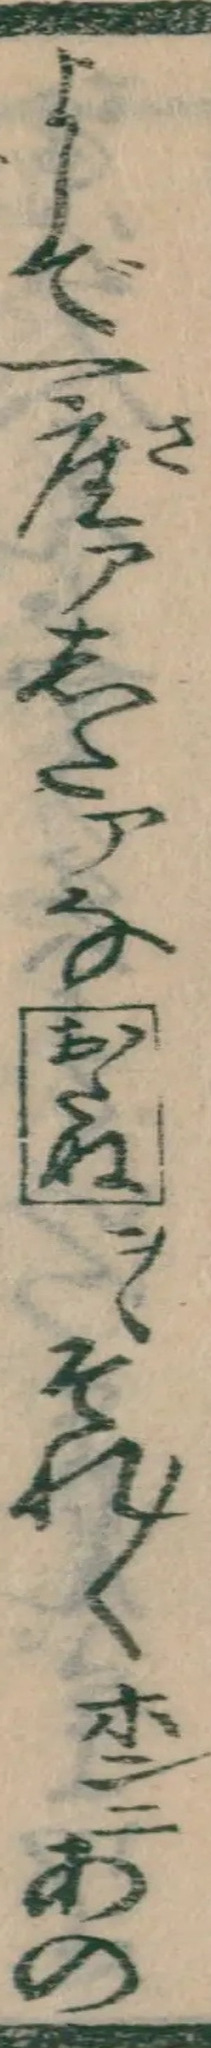よしで一座ァしたァな〈おたね〉ヲヽそれ〳〵ホンニあの
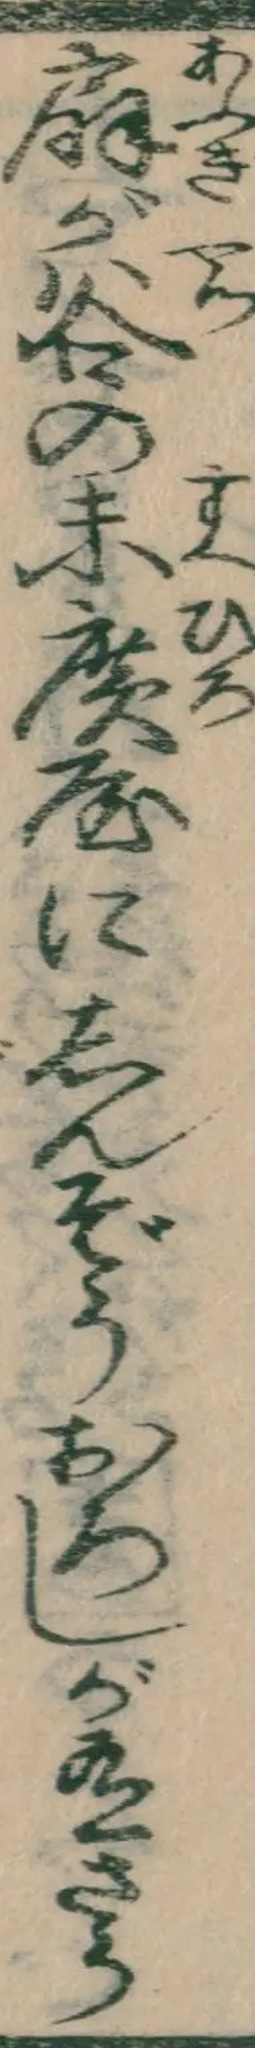扇が谷の末広屋にしんぞうおろしが有さう
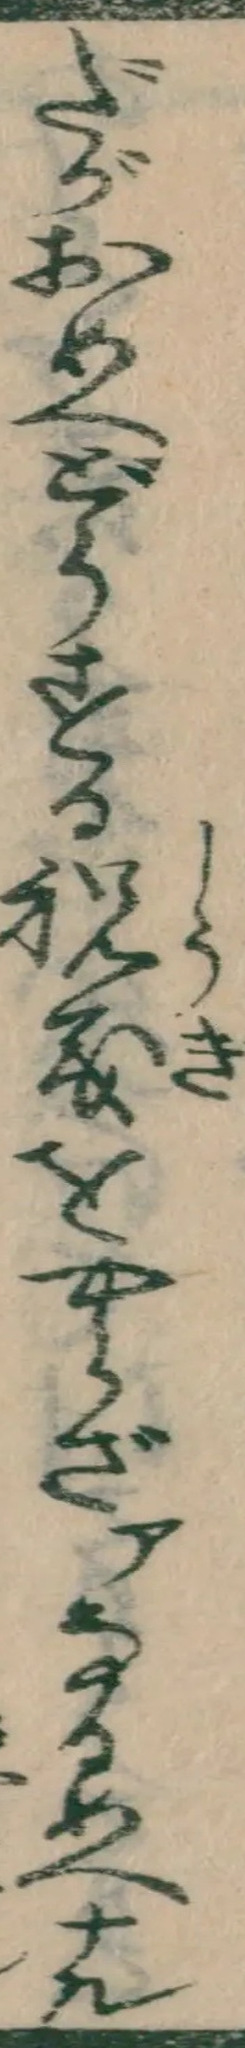だがおめへどうする祝義をやらざァなるめへナル
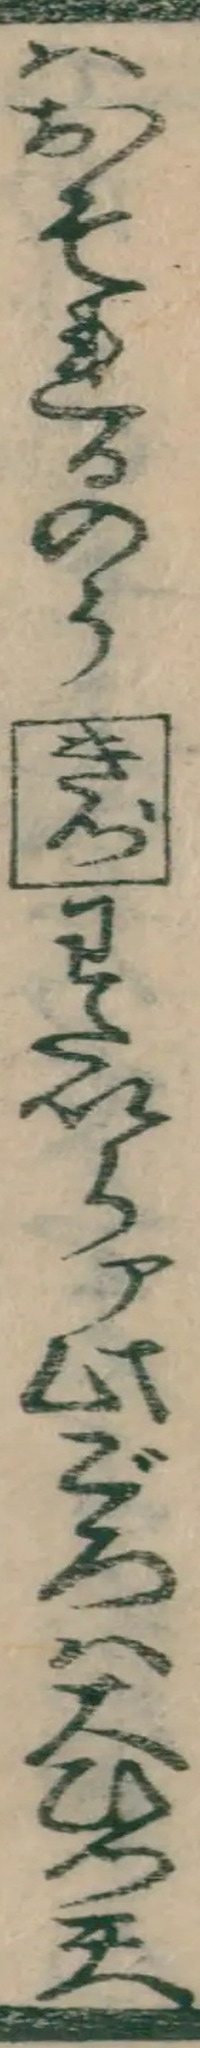はおそれるのう〈きづ〉わたいらァ此ごろは大ひつ天

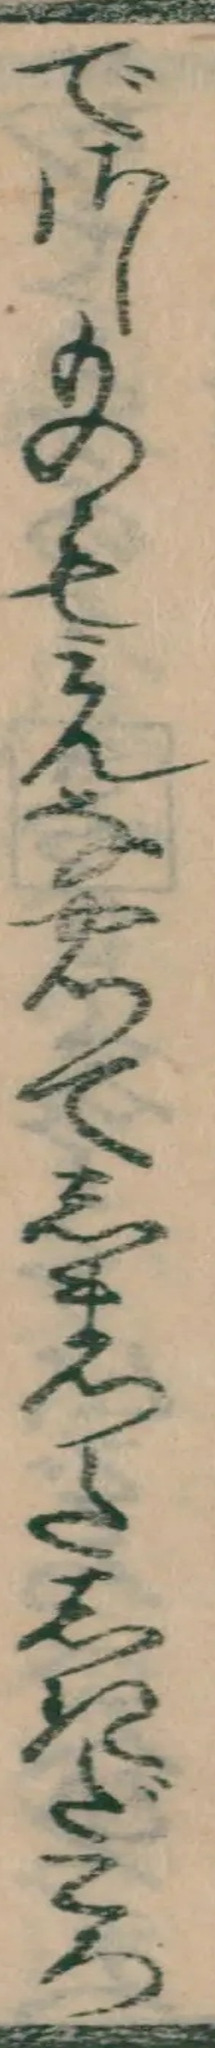でさしものもみんなやつてしまつたしきだころ
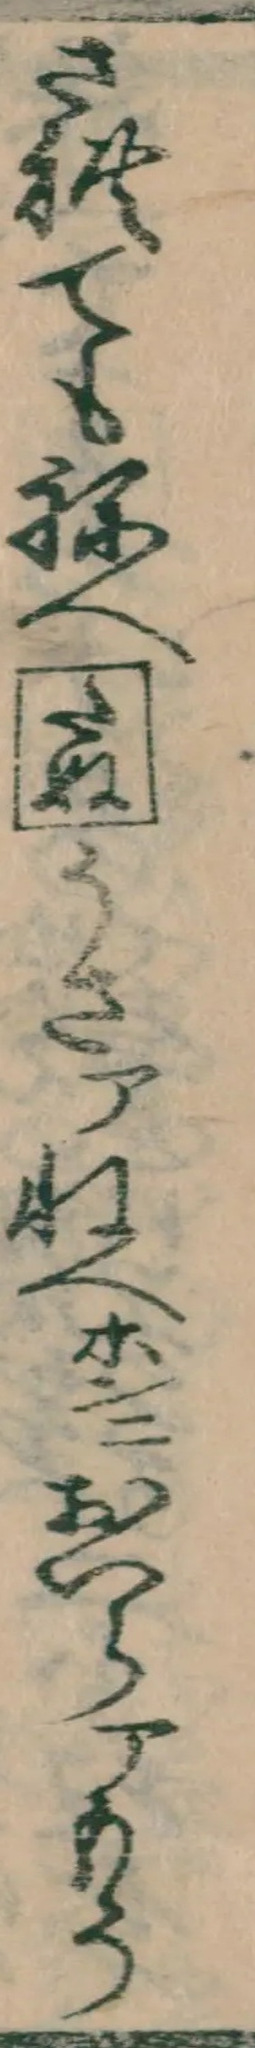されてもねへ〈たね〉うさァねへホンニおいらァもう
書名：教訓読本：大礒風俗仕懸文庫
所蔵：国立国会図書館 National Diet Library, JAPAN
